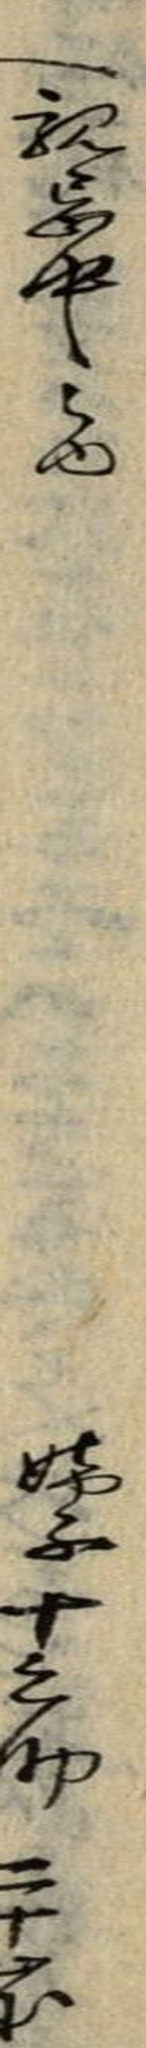親忌中之内嫡子十之助二十歳
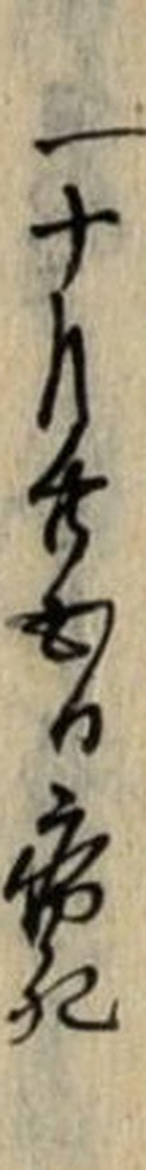十月廿五日病死
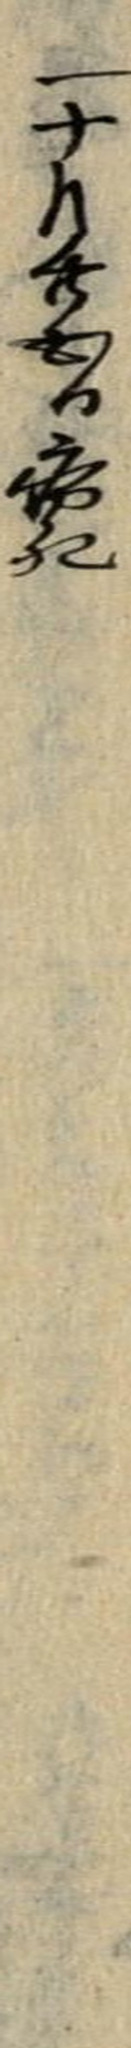十月廿五日病死
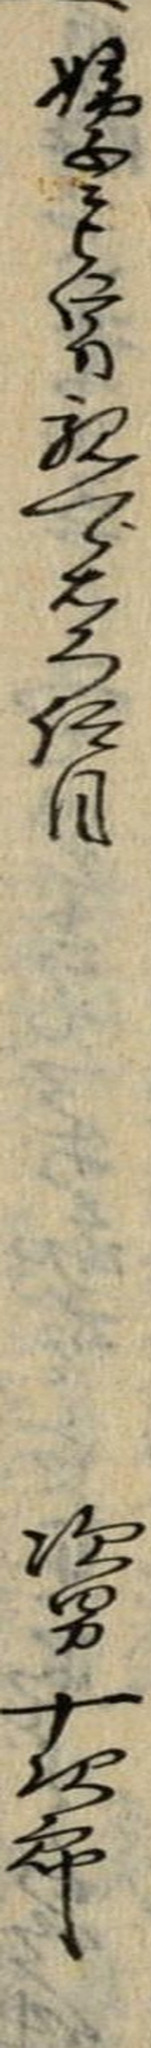嫡子に被仰付親一郎右衛門跡目次男十次郎
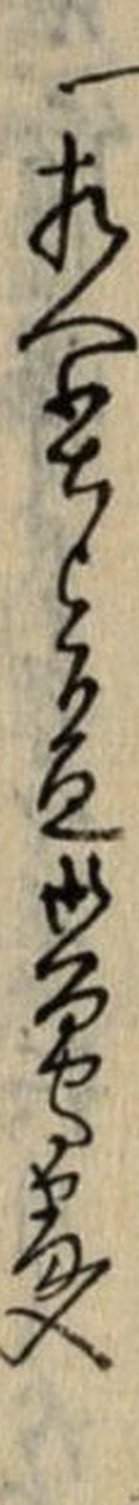拾人ふち被下置御留守番入
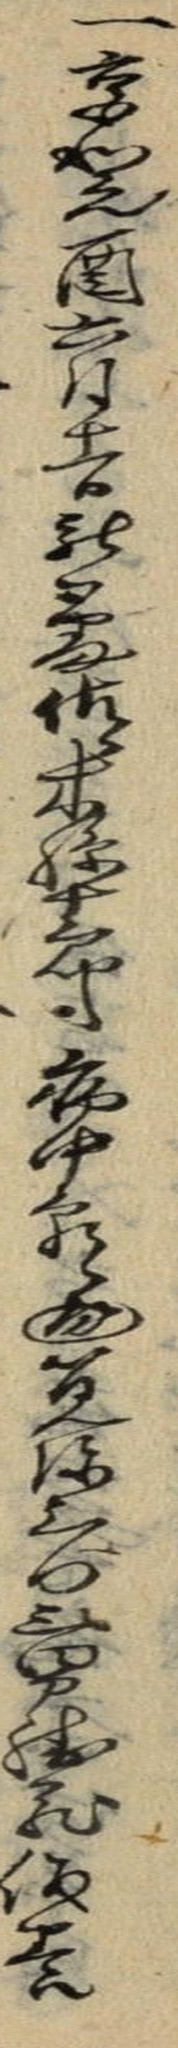一享和元酉六月十一日新御番佐々木孫十郎病中願之通筧弥三右衛門三男勝蔵儀養
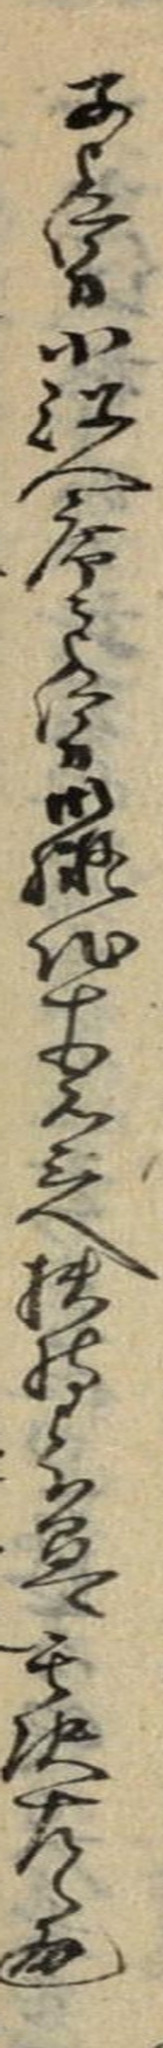子被仰付小役人席に被仰付御擬作十五石三人扶持被下置候其訳左之通
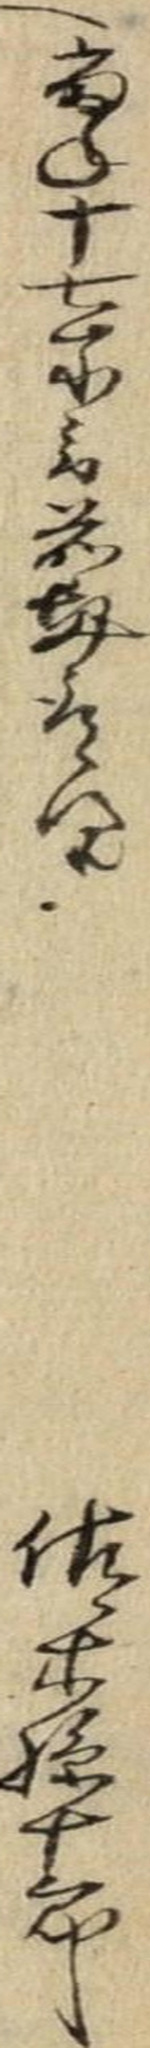当年十七歳に而前髪取候得共佐々木孫十郎
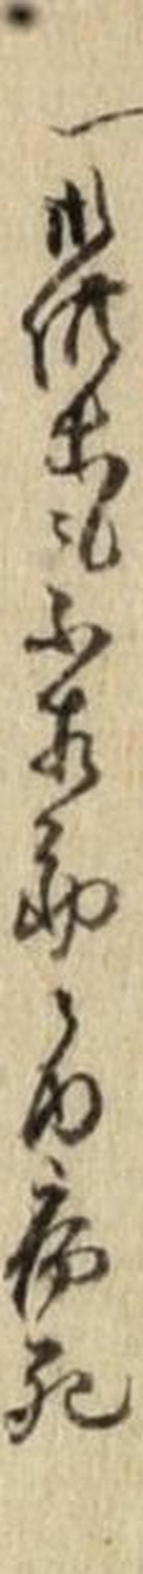御供等も不相勤候内病死
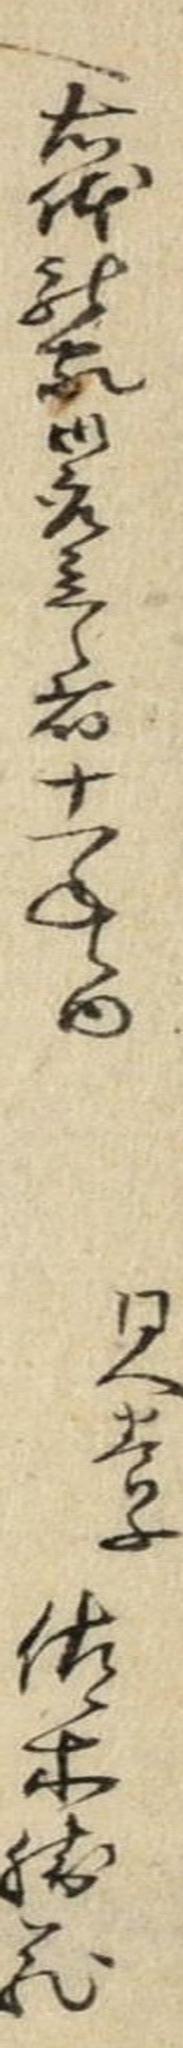右体新家御取立之者十一年之内同人養子佐々木勝蔵
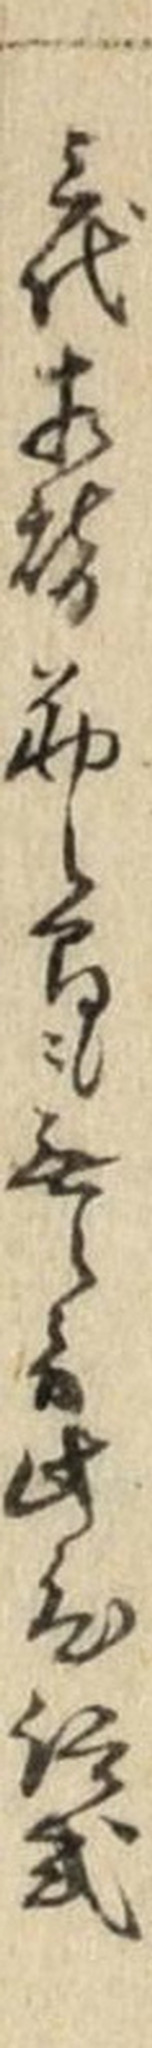三代相替勤候間も無之に付此度跡式
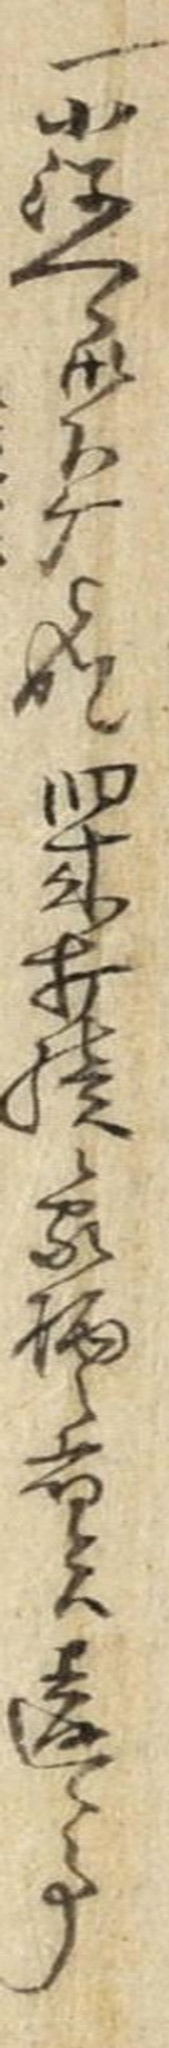小役人へ御下ケ被成候旧来打続候家柄之者とは違候事
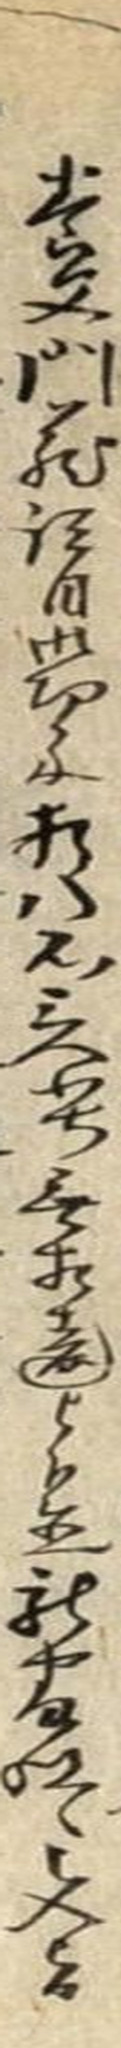養父門蔵跡目御切米拾八石三人ふち無相違被下置新番組へ被入旨
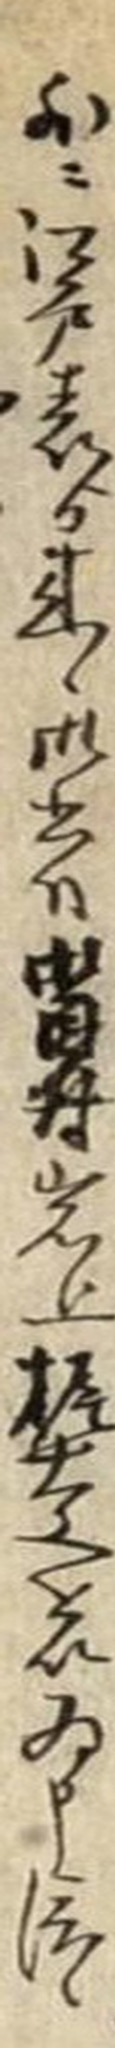外に江戸表ゟ来候御書付御目付岩上梶太夫を以為申渡候
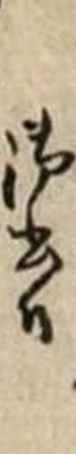御書付
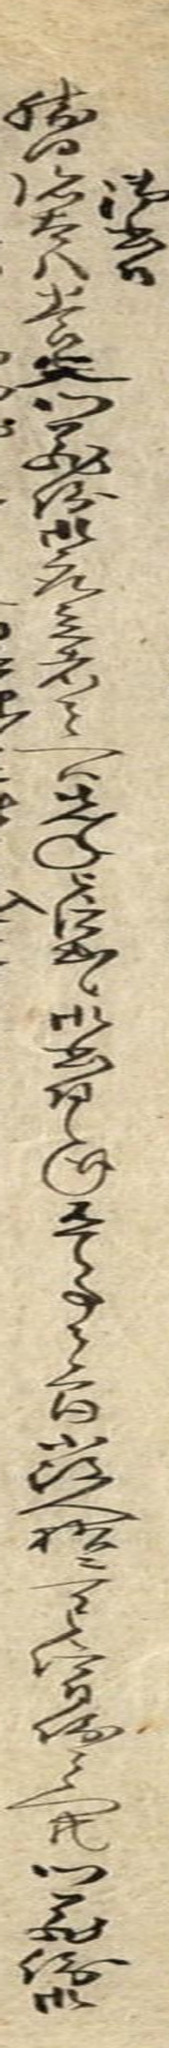勝田弥太八養父門蔵儀御取立者に候へは先年被仰出候御書付之趣有之事に候間小役人格に可被仰付儀に候へ共門蔵儀御
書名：御用并被仰出之部
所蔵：福井県文書館 Fukui Prefectural Archives
